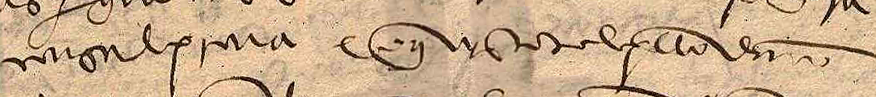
cousa de proua e o q̄ vysto p̄llo dito
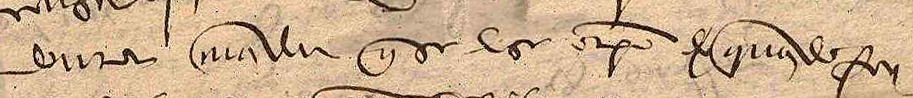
doutor mādou q̄ se dese o tp̄o de quādo foy
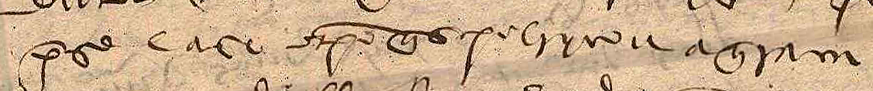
p̄so e asy o tp̄o q̄ se pobrycou a graça
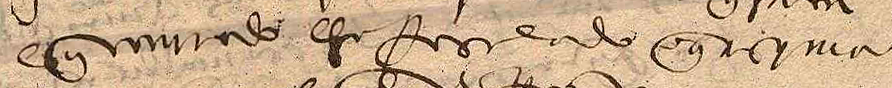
e q̄ comtado lhe fose dado o q̄ asy mā
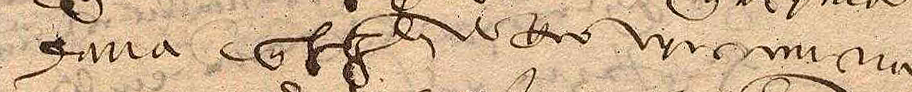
daua e q̄ ho ꝑdor do Reo vyese com sua
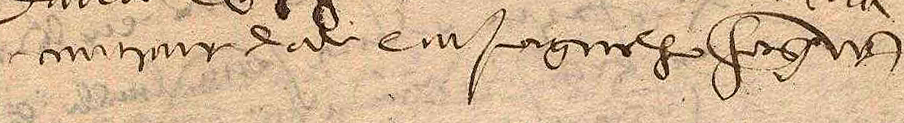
comtraryedade e eu Jorge coelho ho sp̄vy
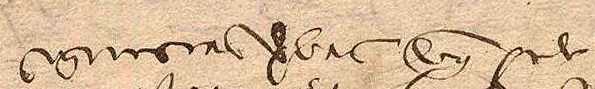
seguese as ꝟbas do q̄ pede
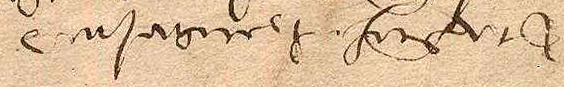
e eu Jorge coelho ho esp̄vy
